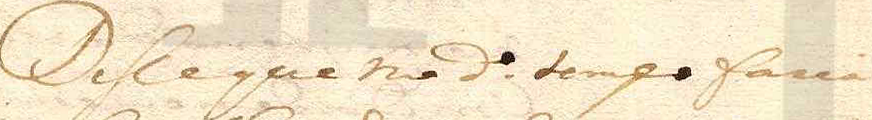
Disse que no d.o tempo fazia
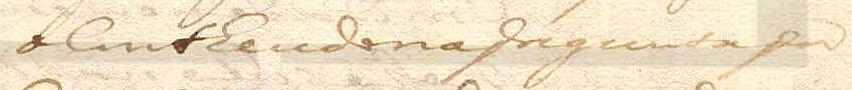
o Contheudo na pregunta por
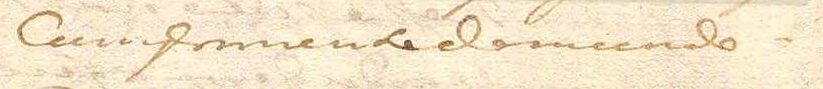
Cumprimento do mundo
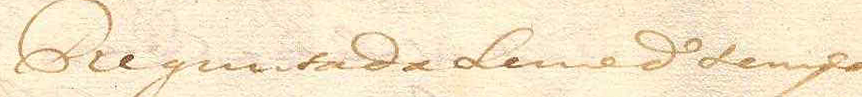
Preguntada se no do tempo
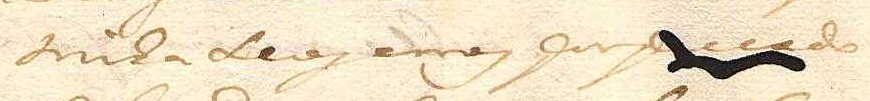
tinha seos erros por peccado
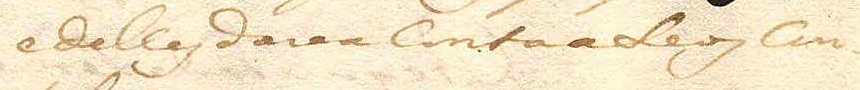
e delles dava conta a seos con
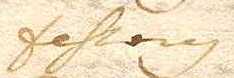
fessores
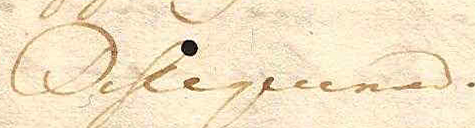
Disse que naõ.
